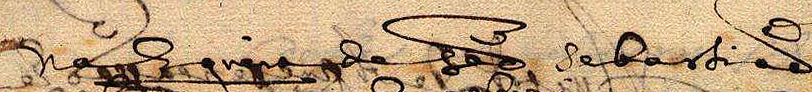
na Egreia de saõ sebastiaõ
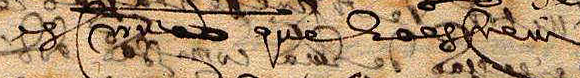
EsCriuaõ que ho escreui
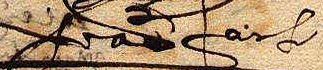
Joaõ farso
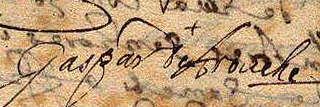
Gaspar de Arouche
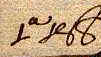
1a testa
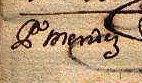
Po mendez
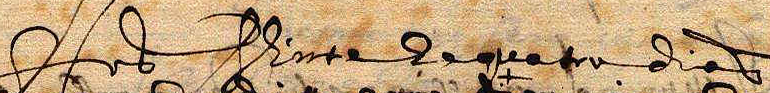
Aos Vinte e quatro dias
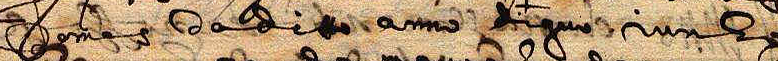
do mes do ditto anno diguo iunho
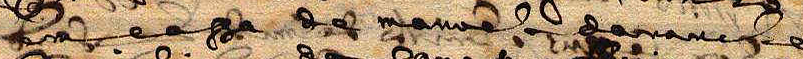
em cassa de manoeL darouche
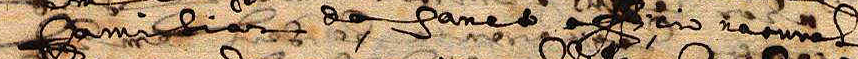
familiar do sancto officio naturaL
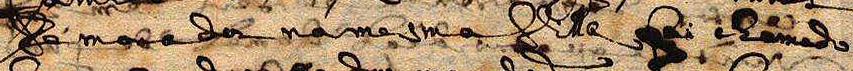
e morador na mesma Villa foi chamado
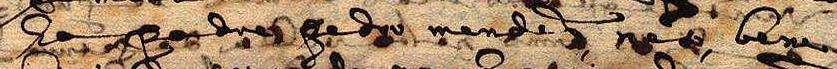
ho padre pedro mendes neto, bene
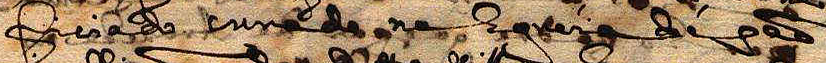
ficiado curado na Egreia de saõ
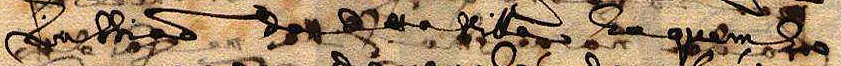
iullião da ditta villa ha quem ho
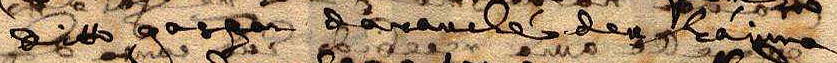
ditto gaspar darouche deu ho iura
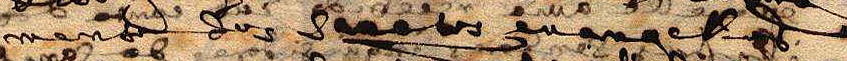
mento dos sanctos euangelhos
